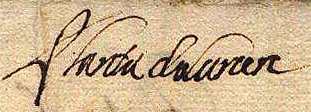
Planta do Carcere
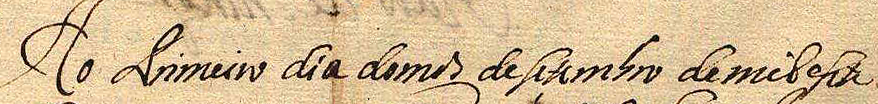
Ao Primeiro dia do mes de setembro de mil e sete
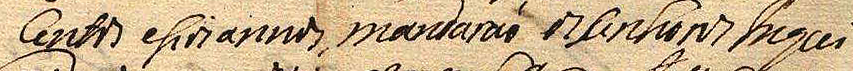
Centos e seis annos, mandaraõ os senhores Inqui
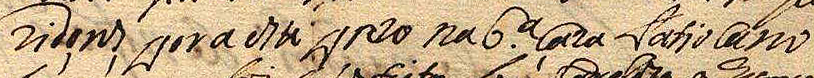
zidores, por a este prezo na 6.a caza Patio Cano
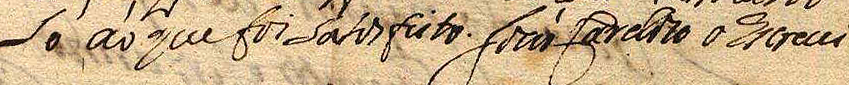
so ao que foi satisfeito. Joaõ Cardozo o Escreui
